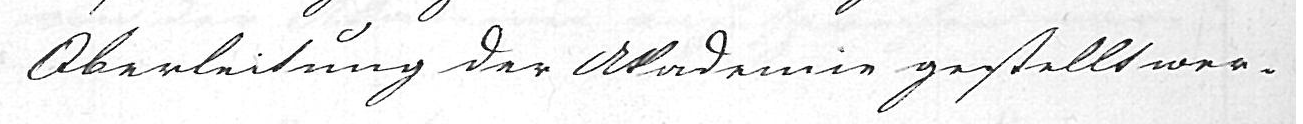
Oberleitung der Akademie gestellt wer-
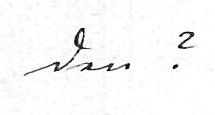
den?
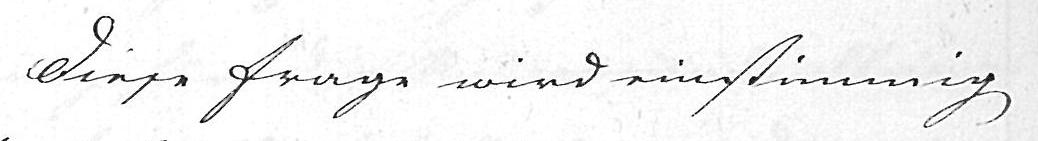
Diese Frage wird einstimmig
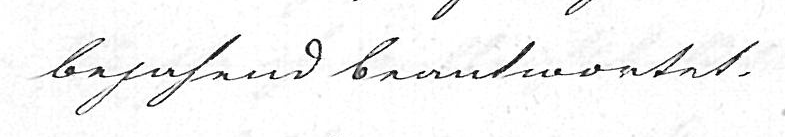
bejahend beantwortet.
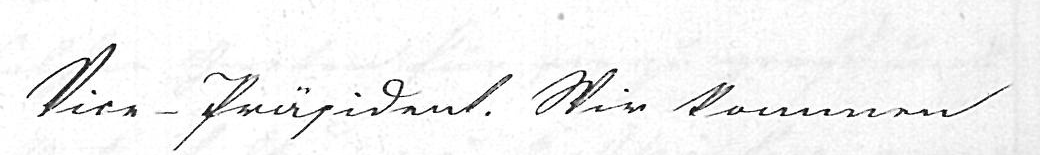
Vice- Präsident. Wir kommen
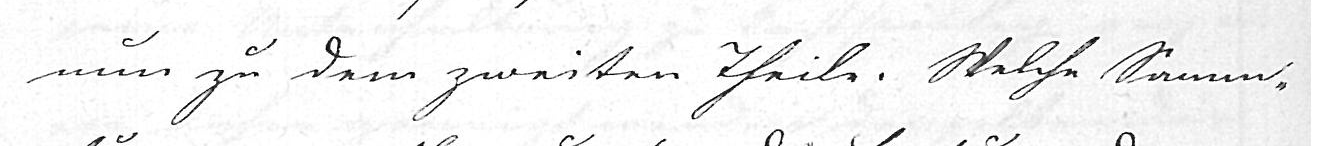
nun zu dem zweiten Theile. Welche Samm-
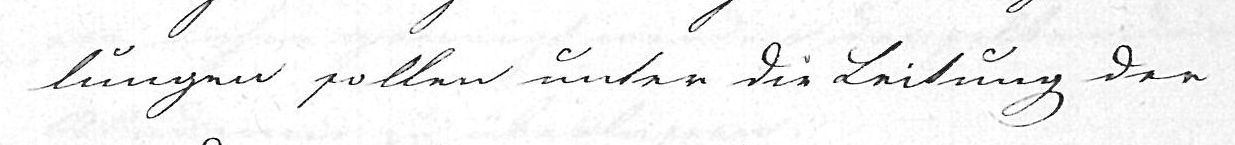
lungen sollen unter die Leitung der
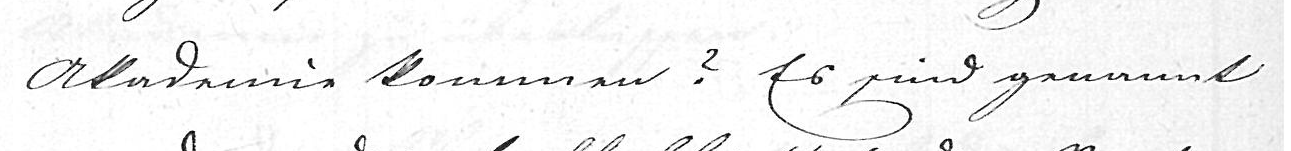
Akademie kommen? Es sind genannt
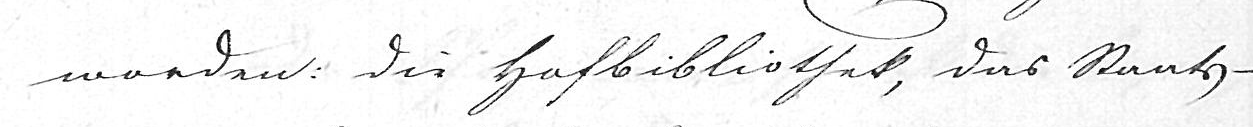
worden: die Hofbibliothek, das Staats-
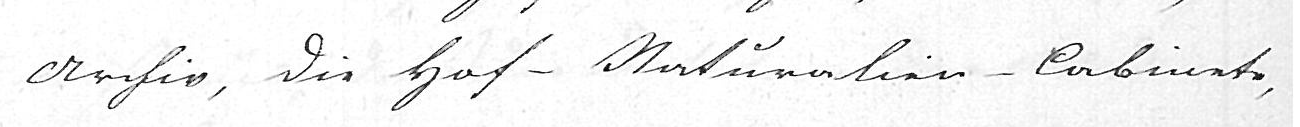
Archiv, die Hof-Naturalien-Cabinete,
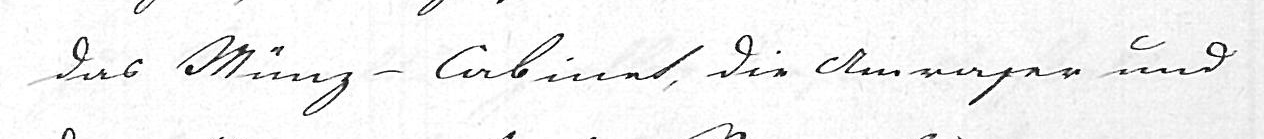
das Münz-Cabinet, die Amraser und
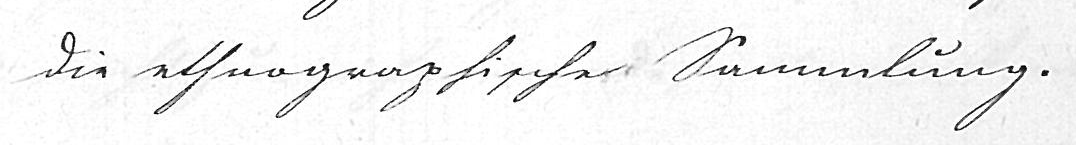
die ethnographische Sammlung.
